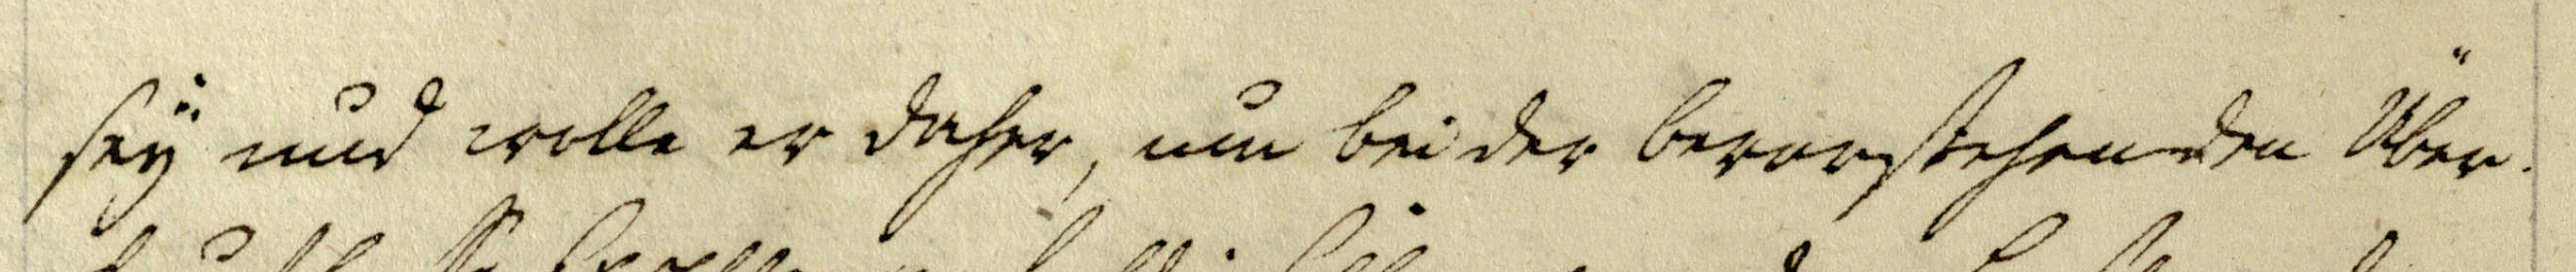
seÿ und wolle er daher, um bei der bevorstehenden Über¬
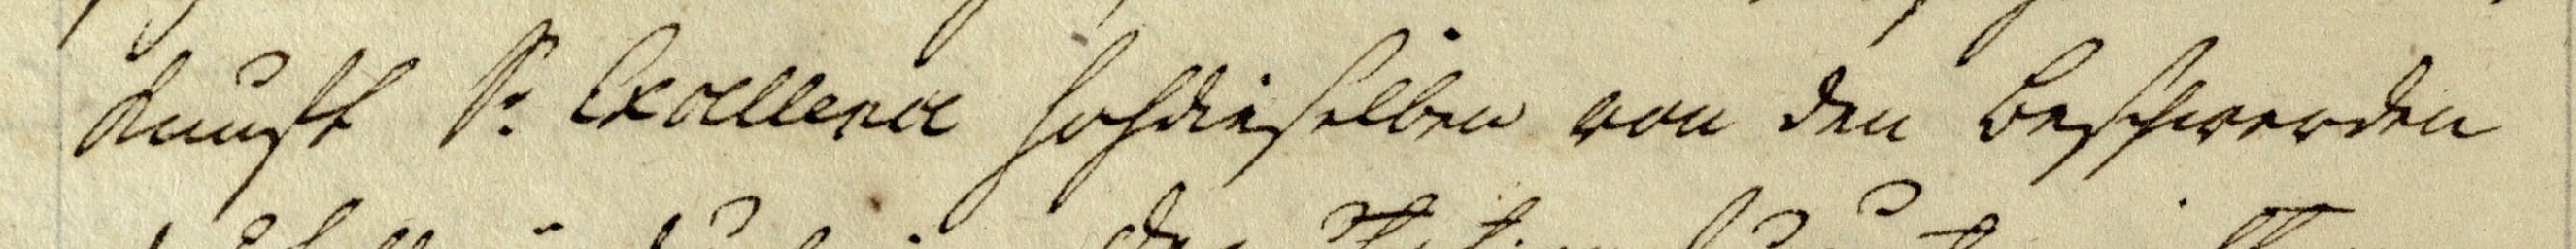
kunft Sr Excellence hochdieselben von den Beschwerden
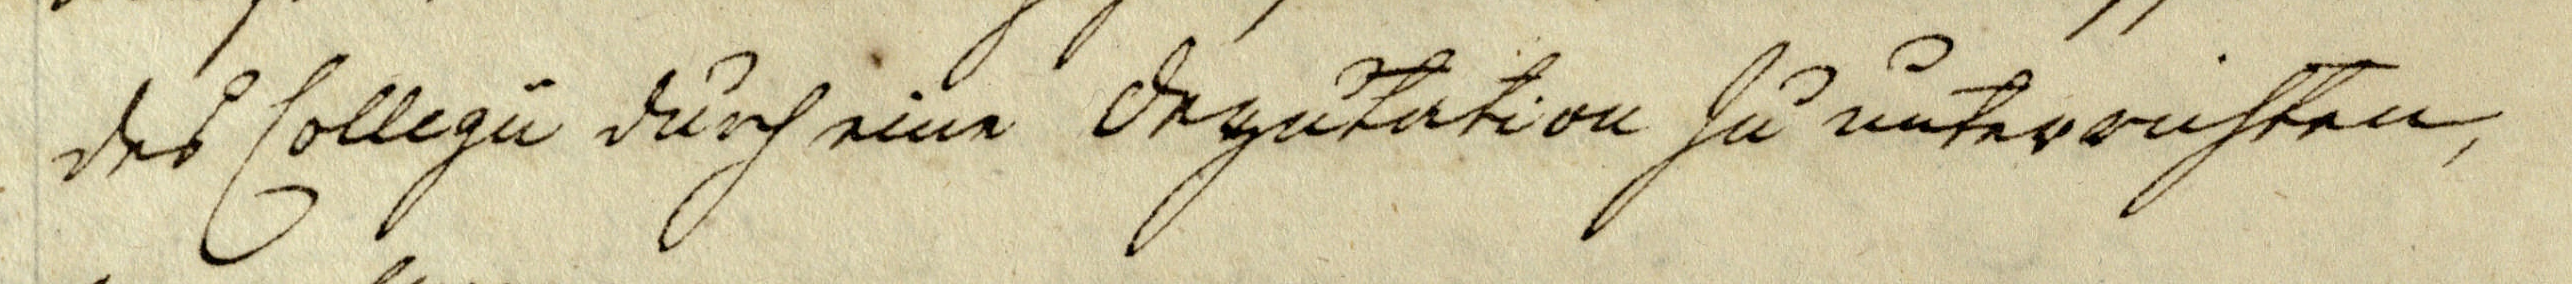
des Collegii durch eine Deputation zu unterrichten,
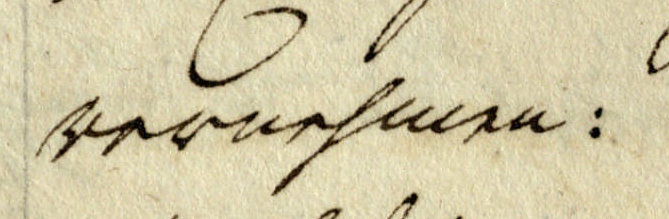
vernehmen:
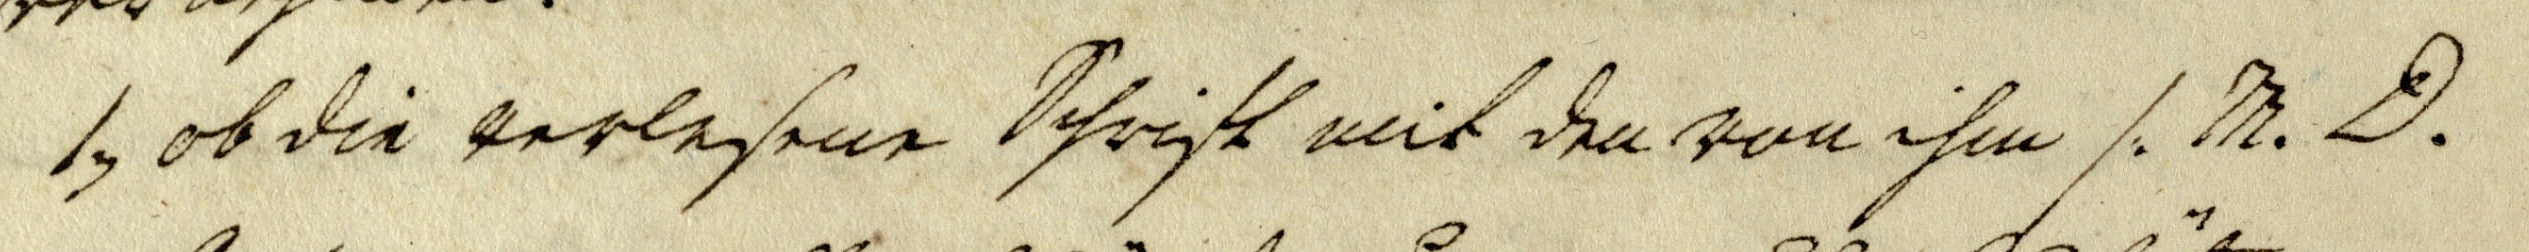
1., ob die verlesene Schrift mit den von ihm /. M. D.
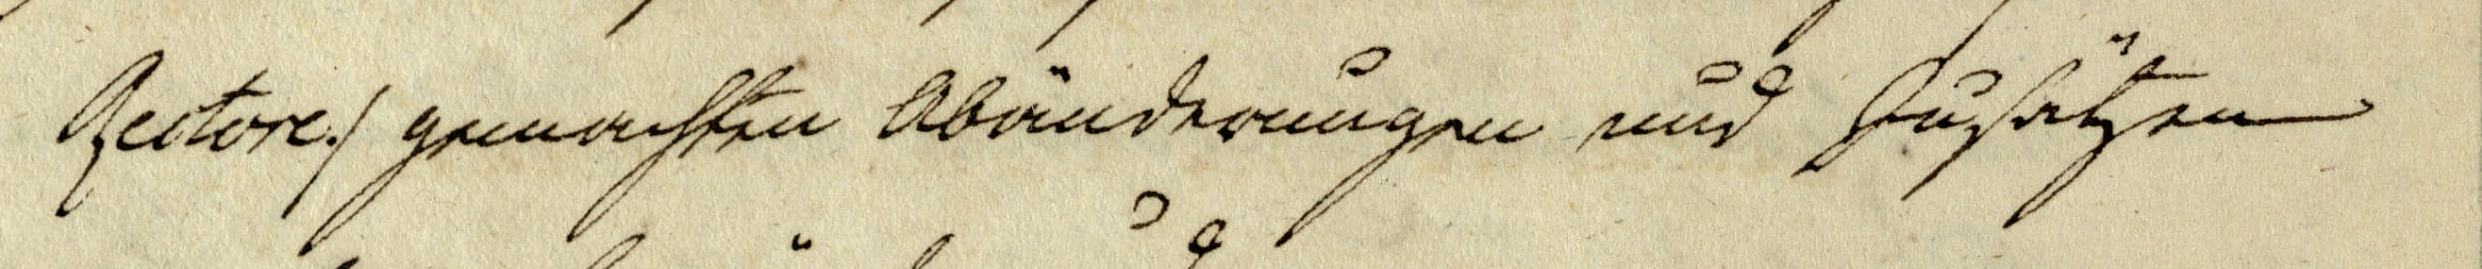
Rectore ./ gemachten Abänderungen und Zusätzen
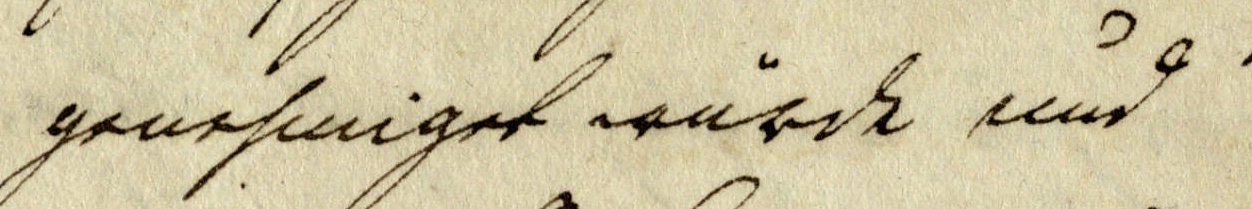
genehmiget würde und
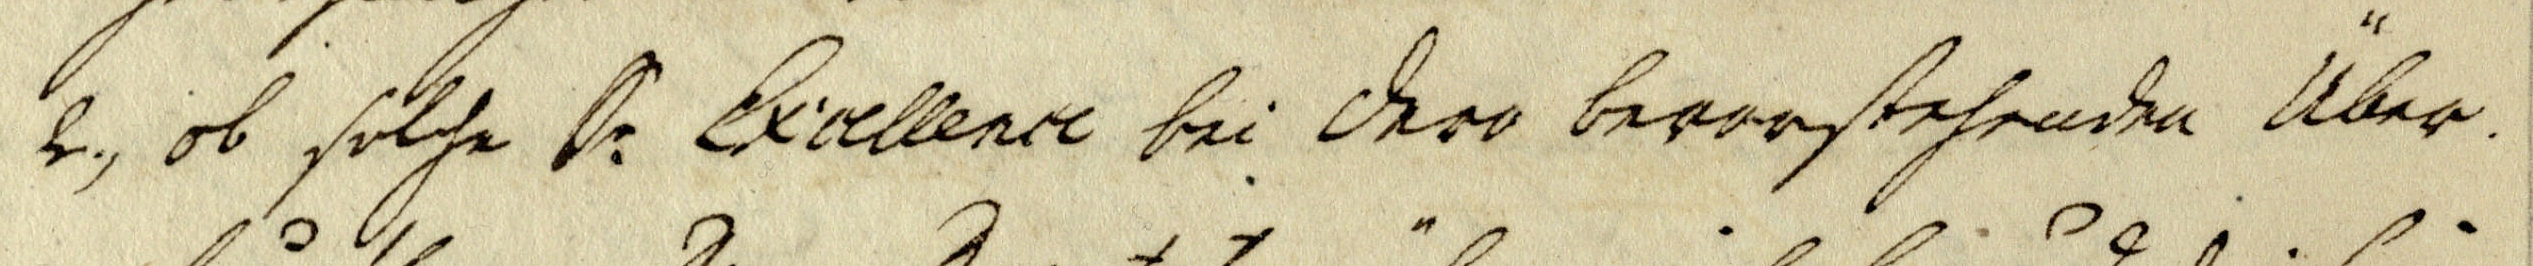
2., ob solche Sr Excellence bei der bevorstehenden Über¬
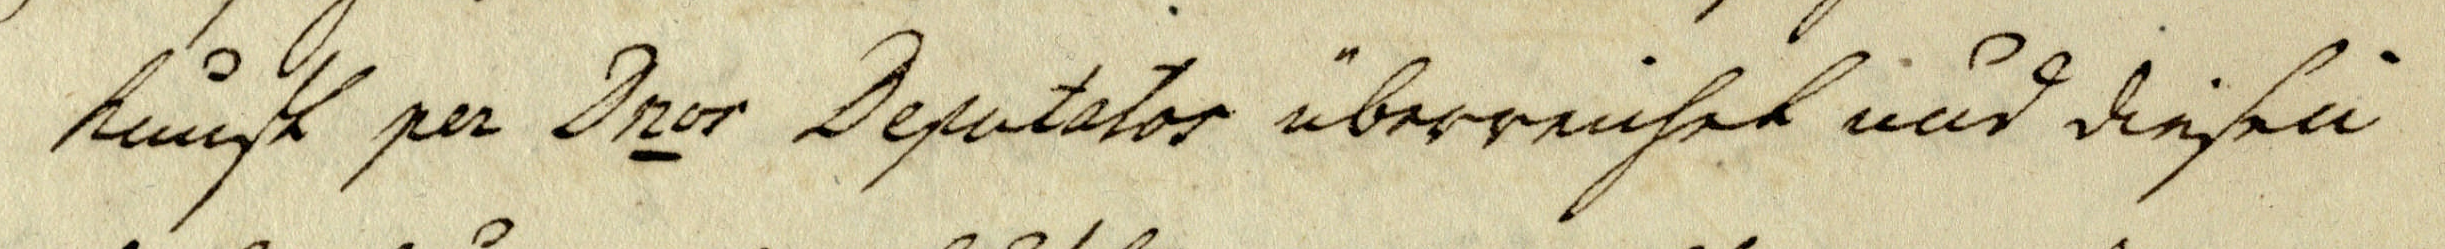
kunft per Dnos Deputatos überreichet und diesen
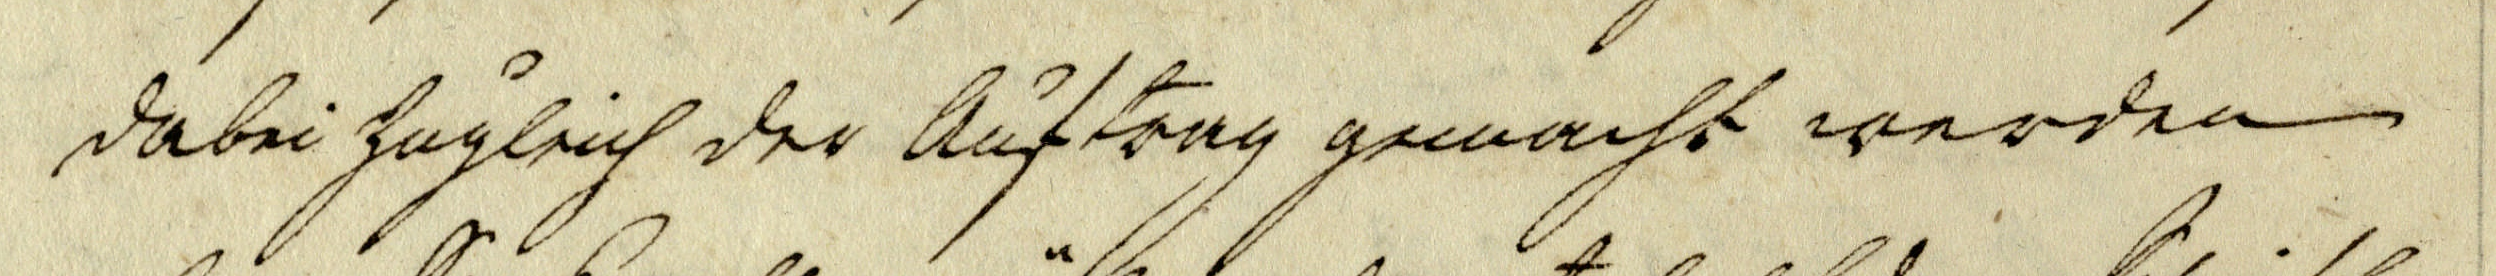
dabei zugleich der Auftrag gemacht werden
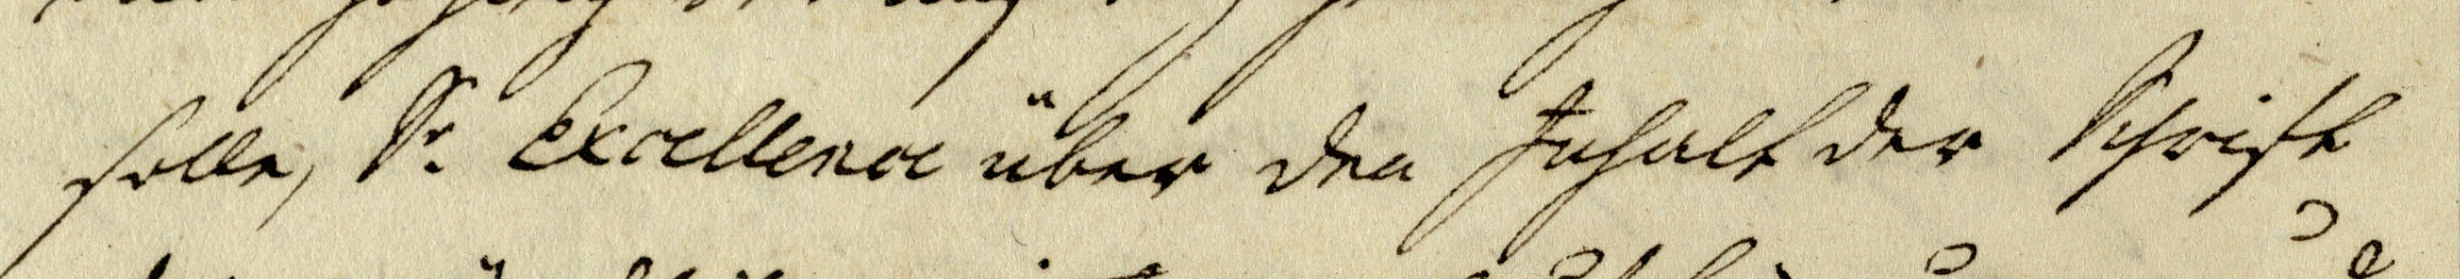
solle, Sr. Excellence über den Inhalt der Schrift
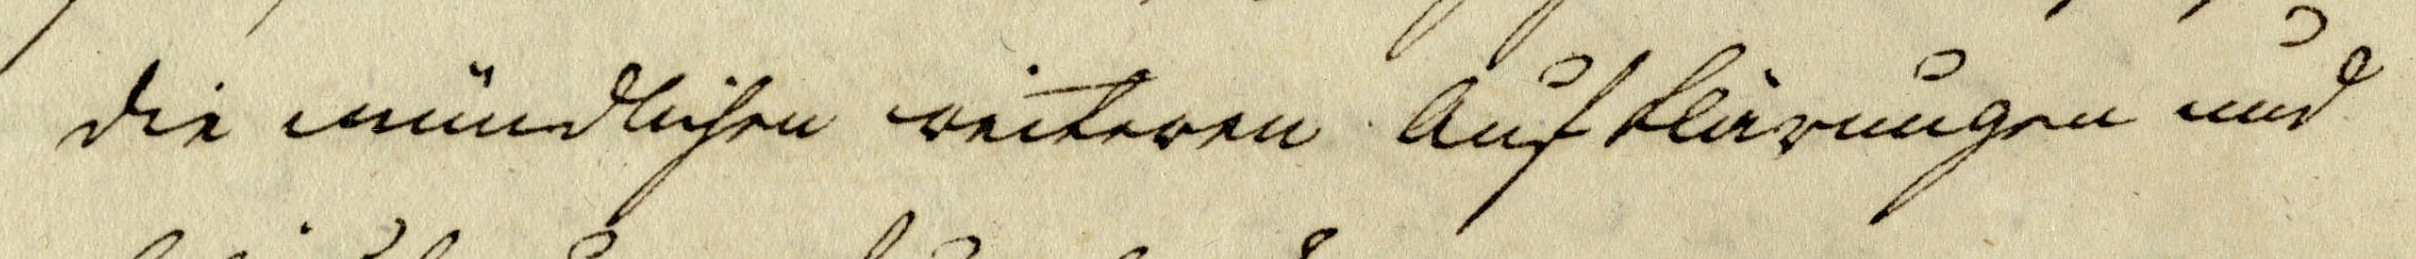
die mündlichen weiteren Aufklärungen und
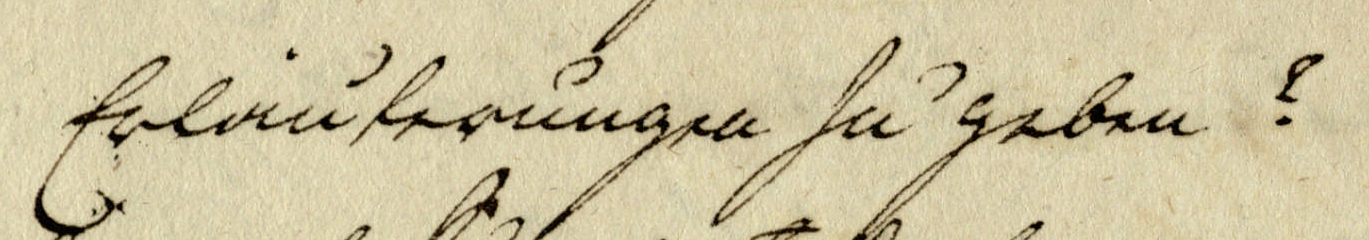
Erläuterungen zu geben ?
